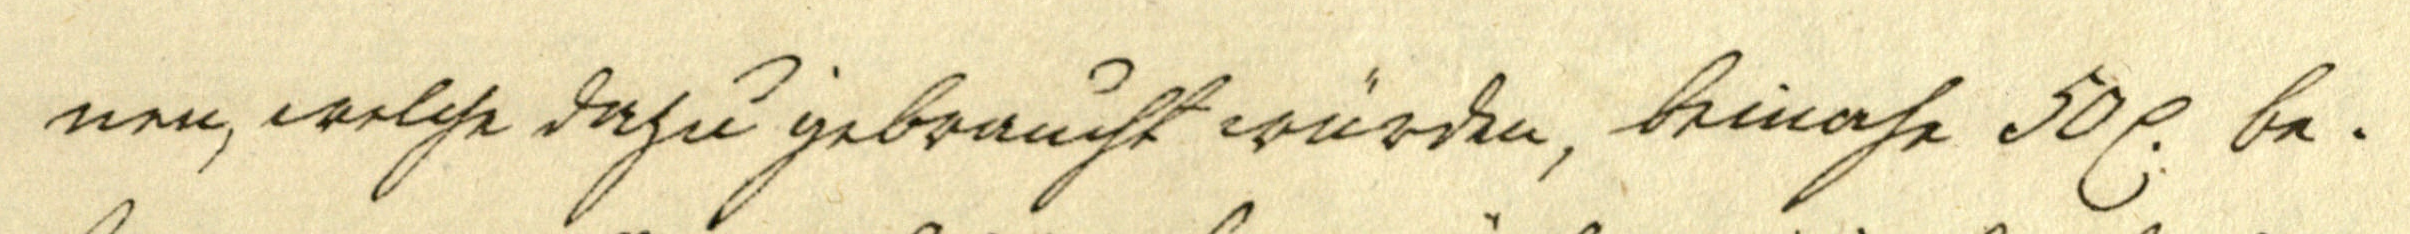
nen, welche dazu gebraucht würden, beinahe 50 l. be¬
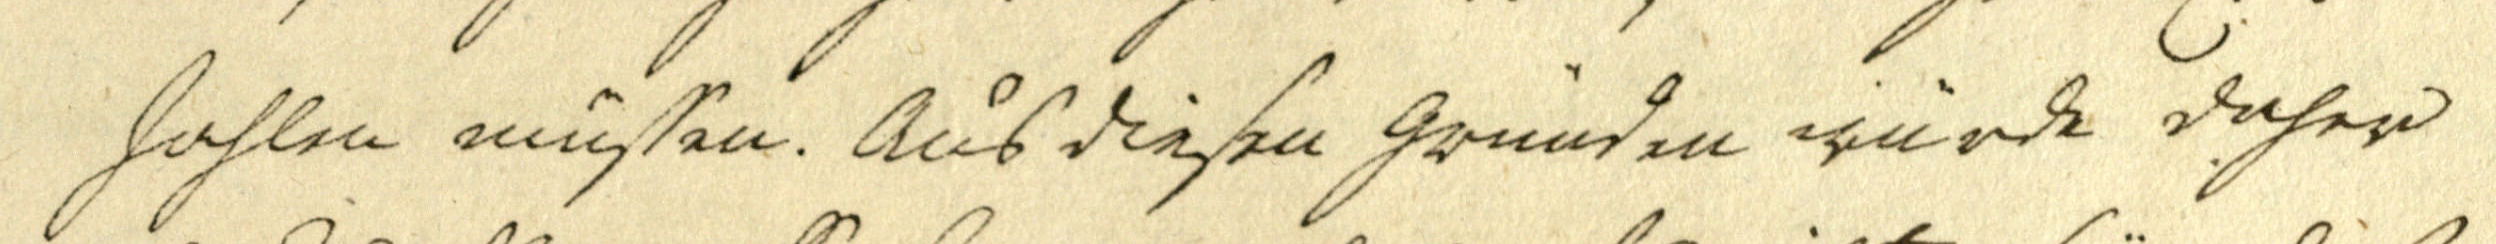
zahlen müssen. Aus diesen Gründen würde daher
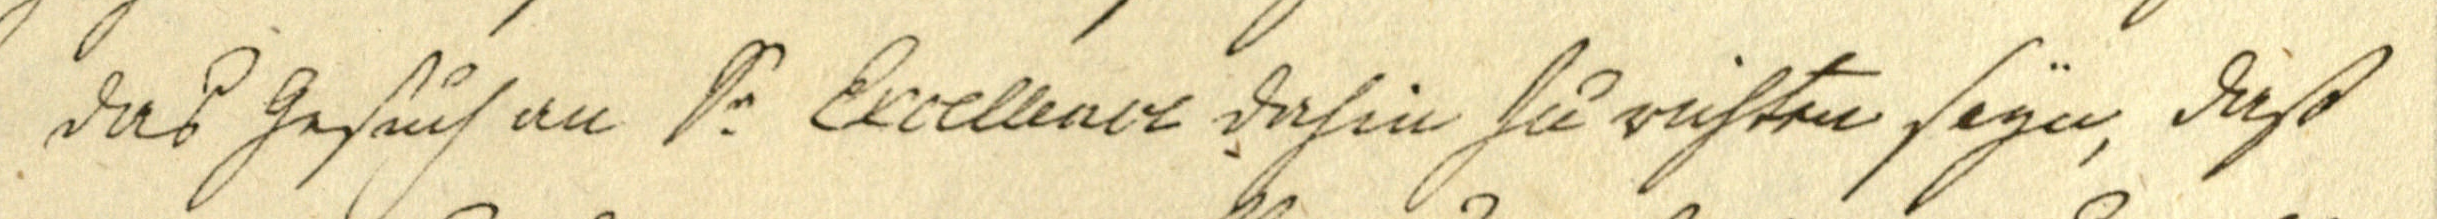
das Gesuch an Sr. Excellence dahin zu richten seÿn, daß
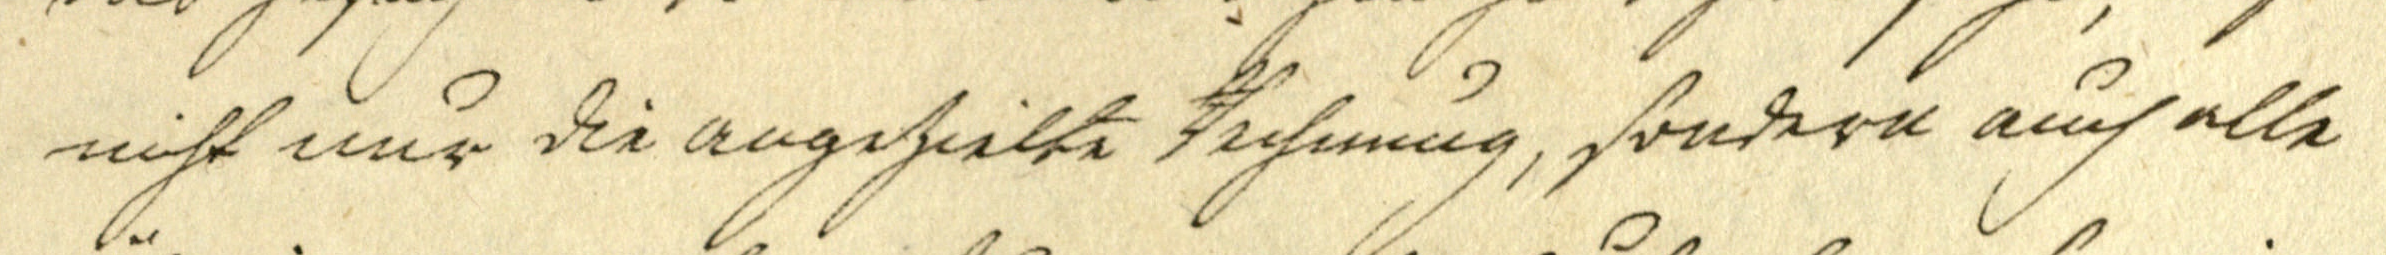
nicht nur die angezielte Rechnung, sondern auch alle
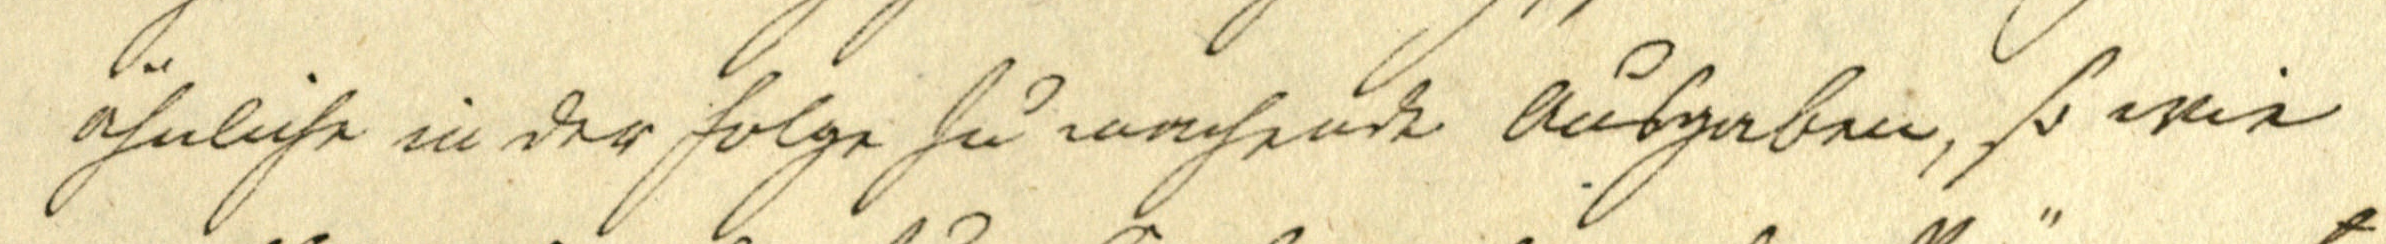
ähnliche in der folge zu machende Ausgaben, so wie
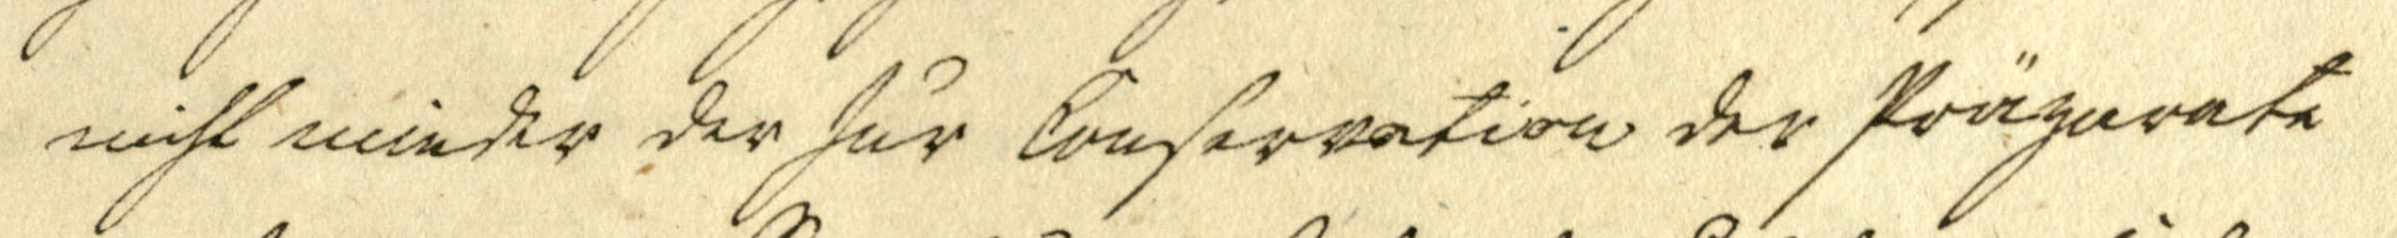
nicht minder der zur Conservation der Präparate
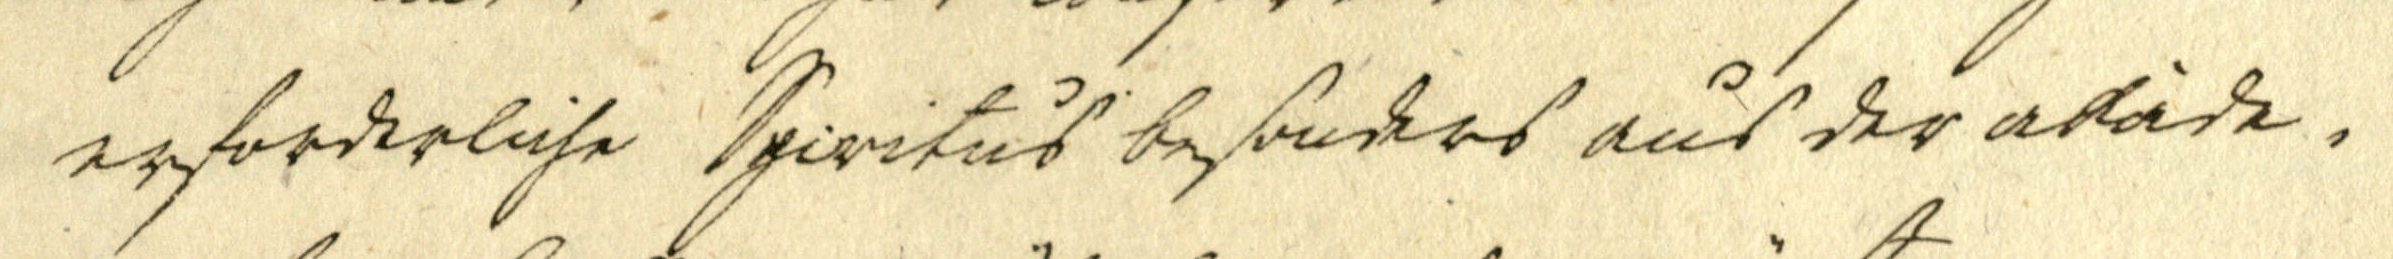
erforderliche Spiritus besonders aus der akade¬
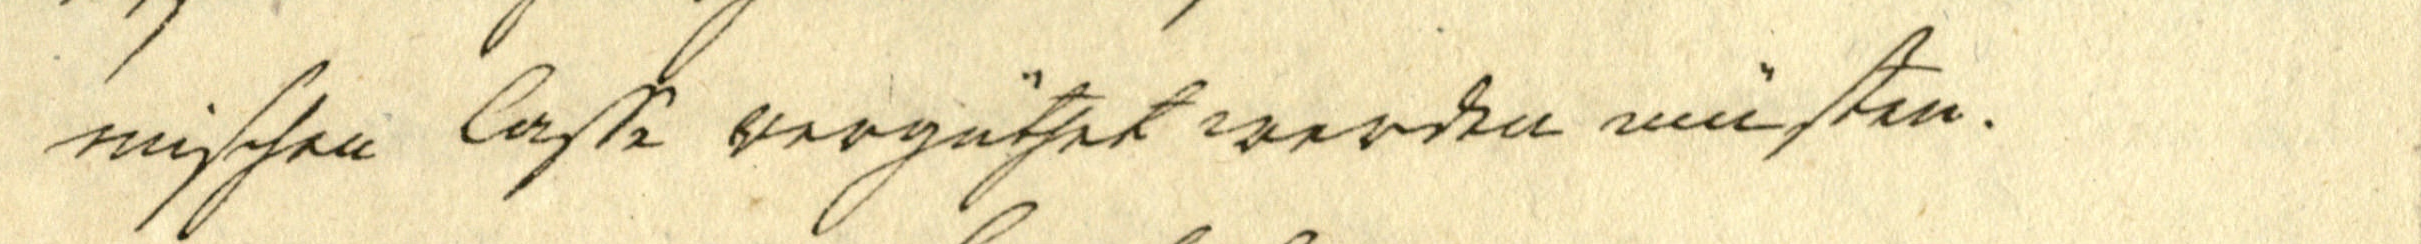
mischen Casse vergüthet werden müsten.
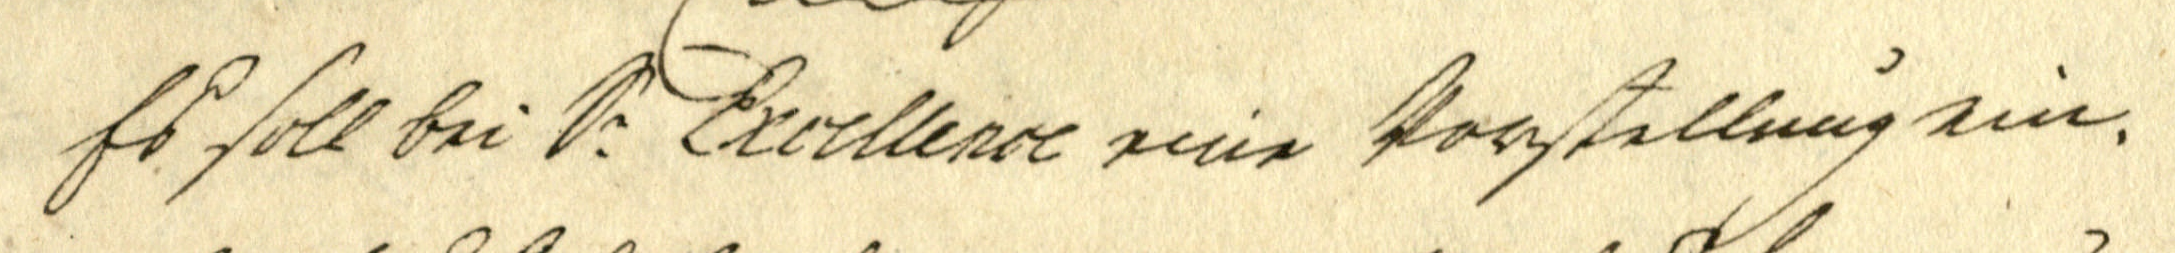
Es soll bei Sr. Excellence eine Vorstellung ein¬
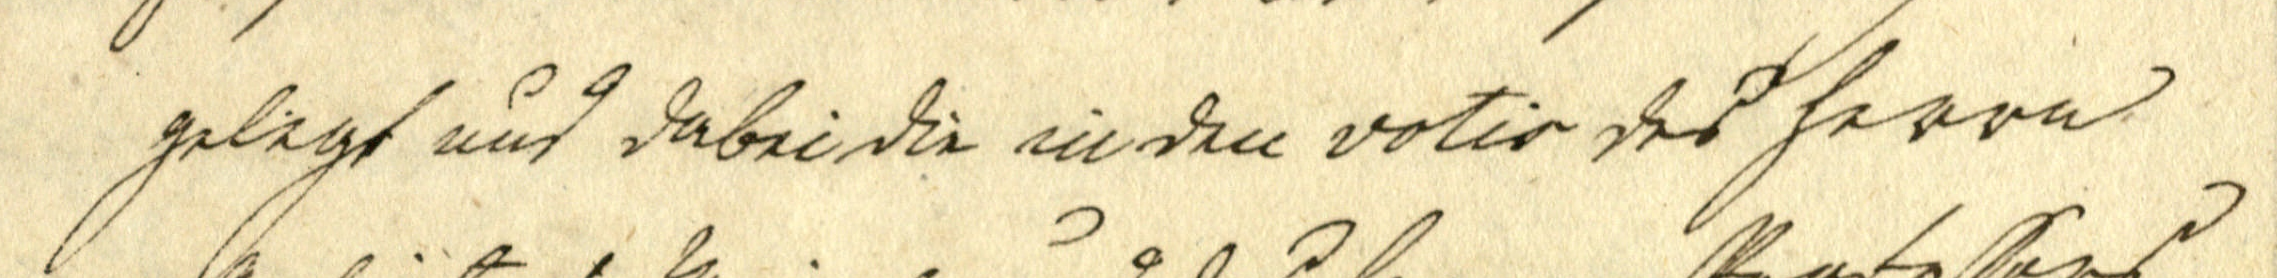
gelegt und dabei die in den votis des herrn
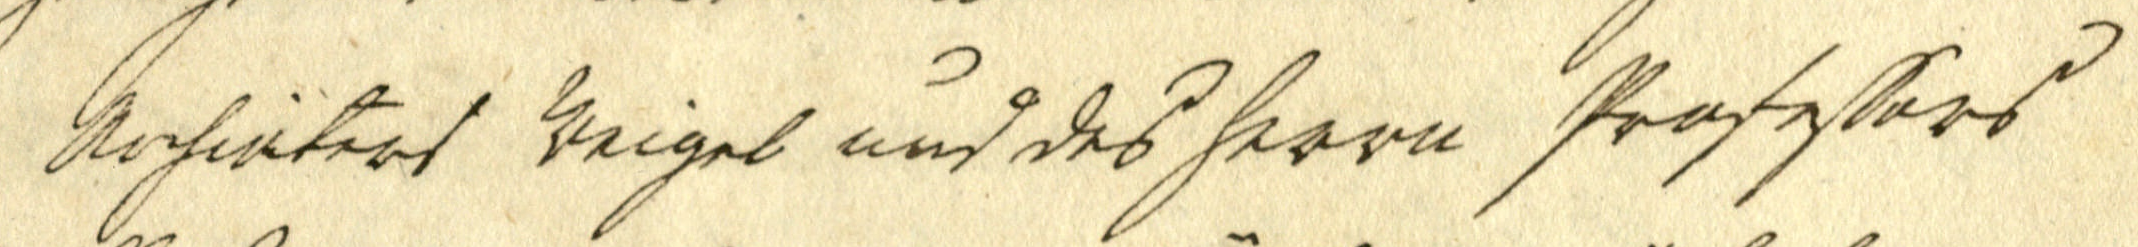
Archiaters Weigel und des herrn Professors
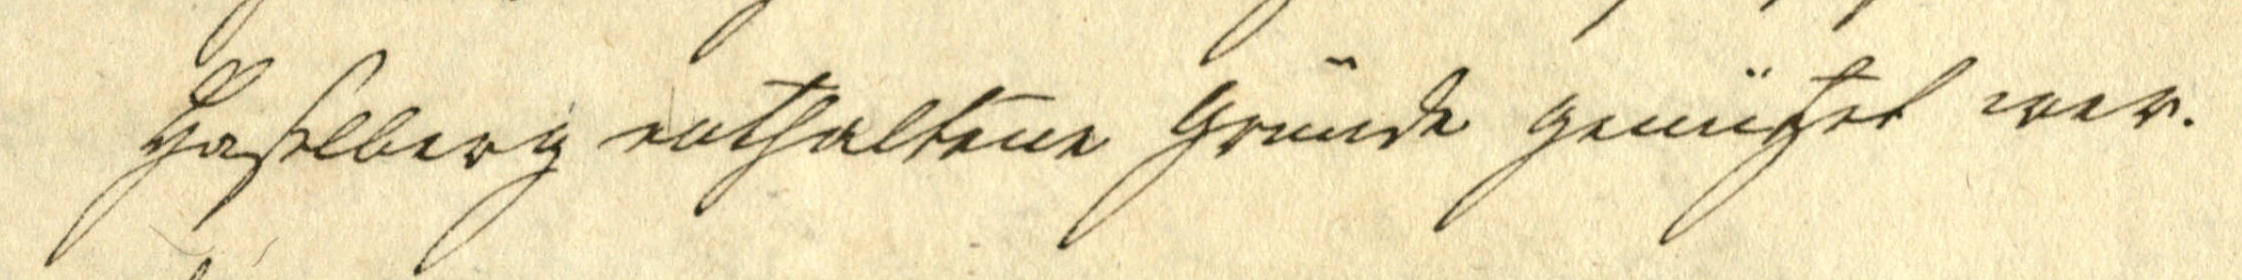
Haselberg enthaltene Gründe genützet wer¬
